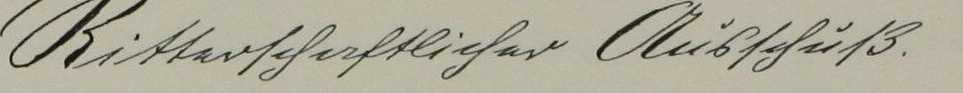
Ritterschaftlicher Ausschuß
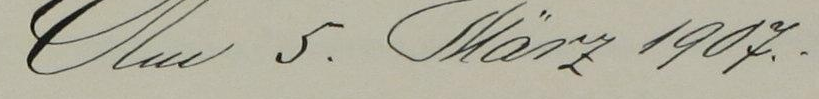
Am 5. März 1907.
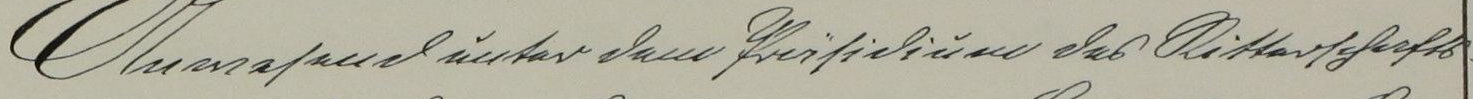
Anwesend unter dem Präsidium des Ritterschafts-
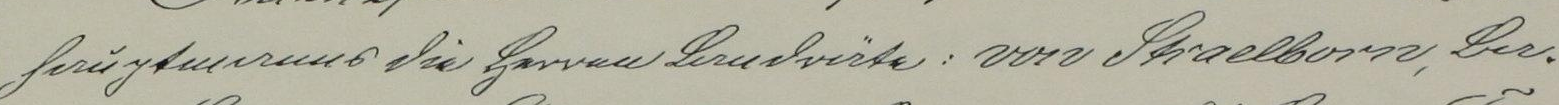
hauptmanns die Herren Landräte: von Straelborn, Ba-
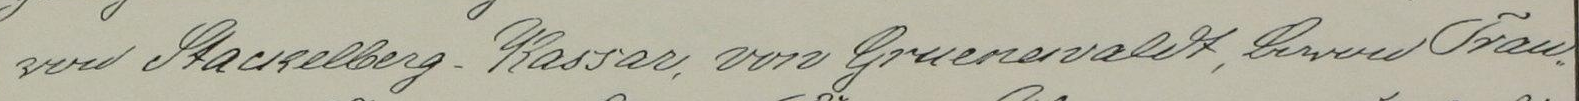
ron Stackelberg-Kassar, von Gruenewaldt, Baron Trau-
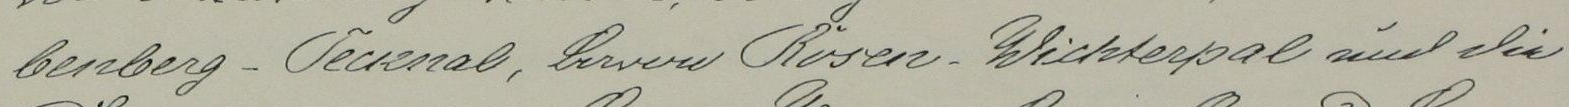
benberg-Tecknal, Baron Rosen-Wichterpal und die
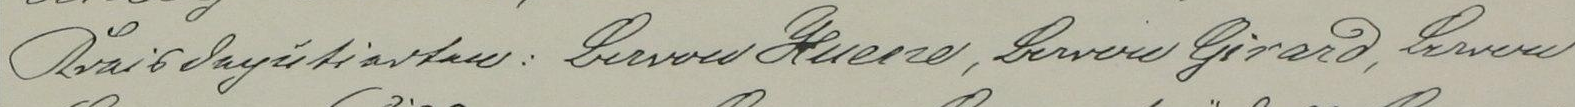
Kreisdeputierten: Baron Huene, Baron Girard, Baron
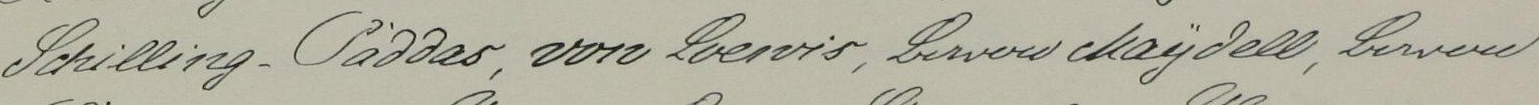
Schilling-Paddas, von Loewis, Baron Maydell, Baron
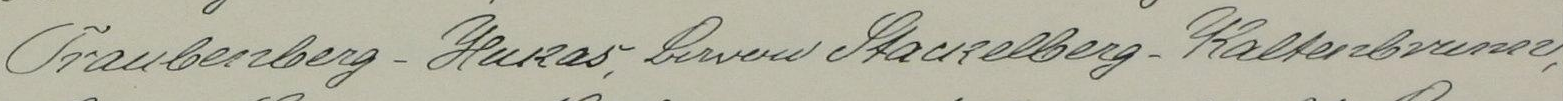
Traubenberg-Hukas, Baron Stackelberg-Kaltenbrunn,
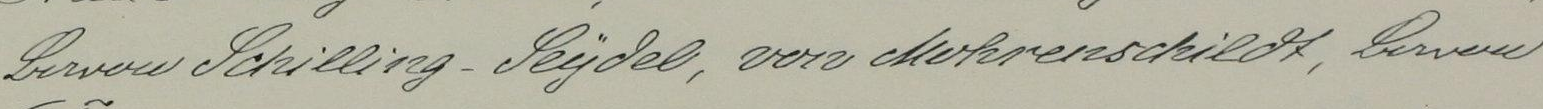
Baron Schilling-Seydel, von Mohrenschildt, Baron
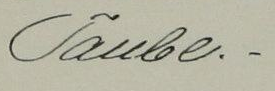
Taube.
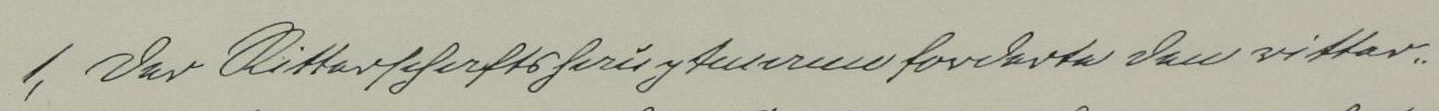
1. Der Ritterschaftshauptmann forderte den ritter-
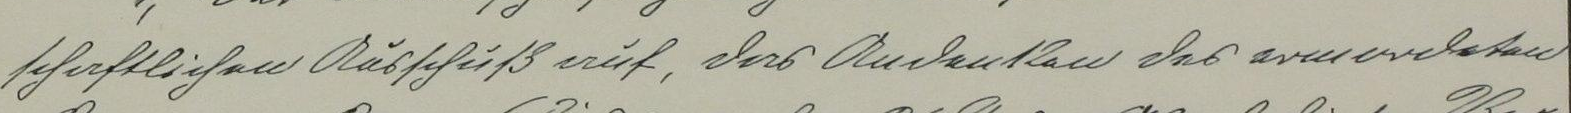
schaftlichen Ausschuß auf, das Andenken des ermordeten
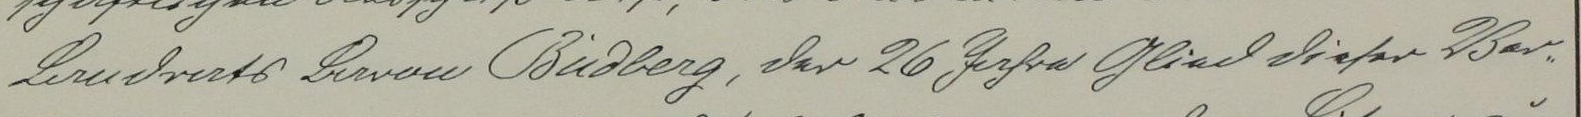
Landrats Baron Budberg, der 26 Jahre Glied dieser Ver-
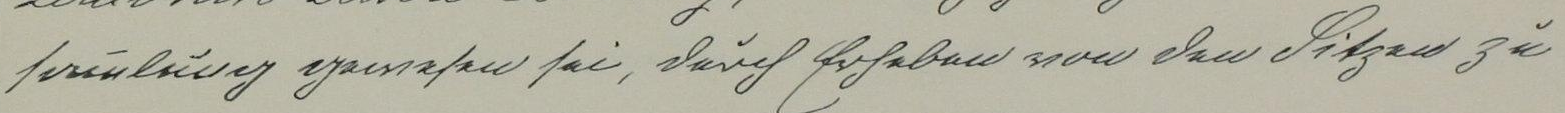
sammlung gewesen sei, durch Erheben von den Sitzen zu
